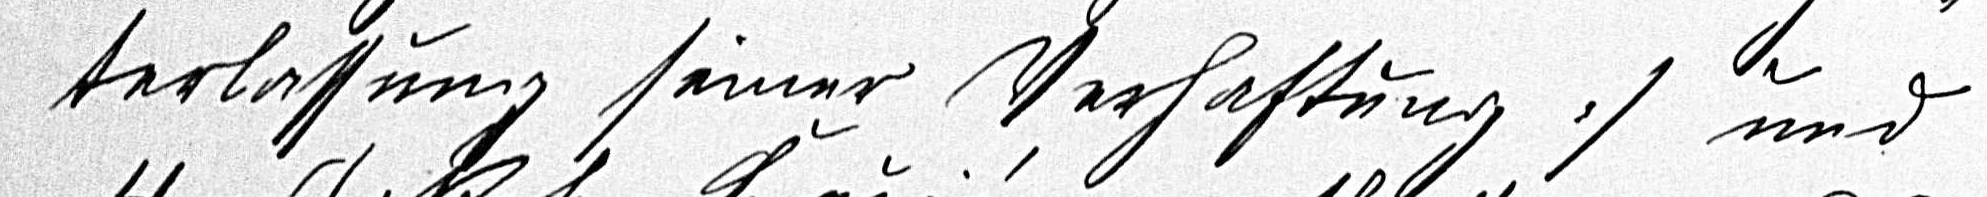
terlassung seiner Verhaftung) und
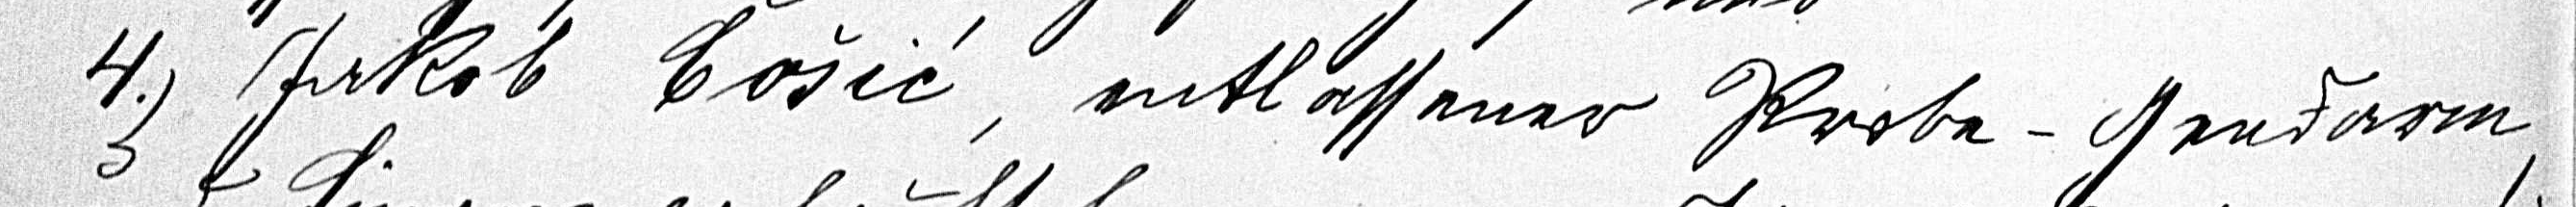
4) Jakob Čošić, entlassener Probe-Gendarm
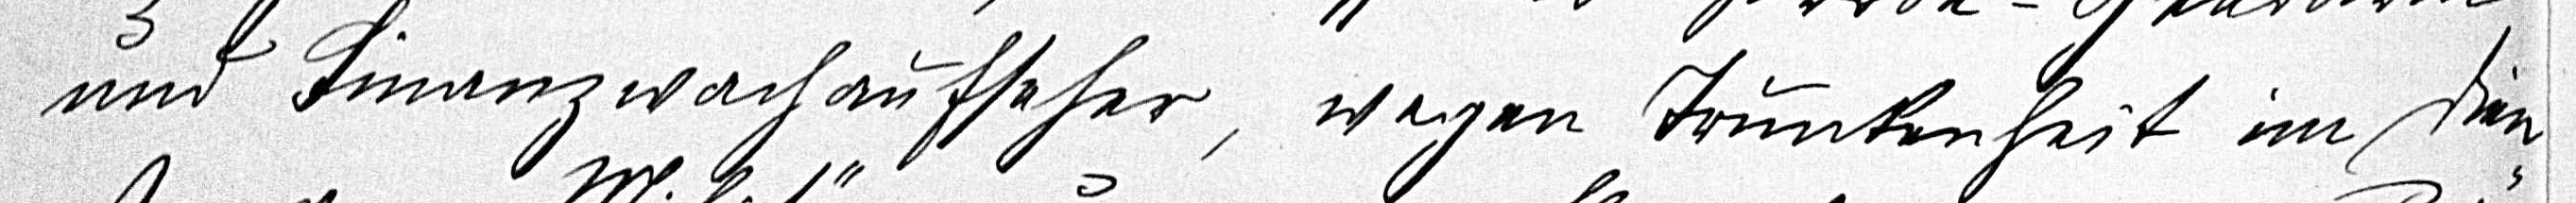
und Finanzwachaufseher, wegen Trunkenheit im Dien¬
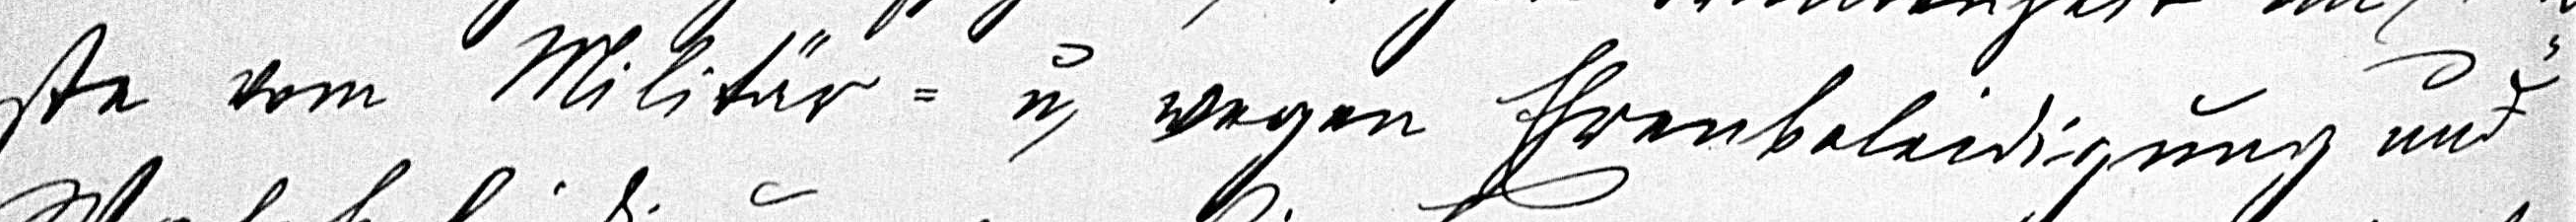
ste vom Militär- u. wegen Ehrenbeleidigung und
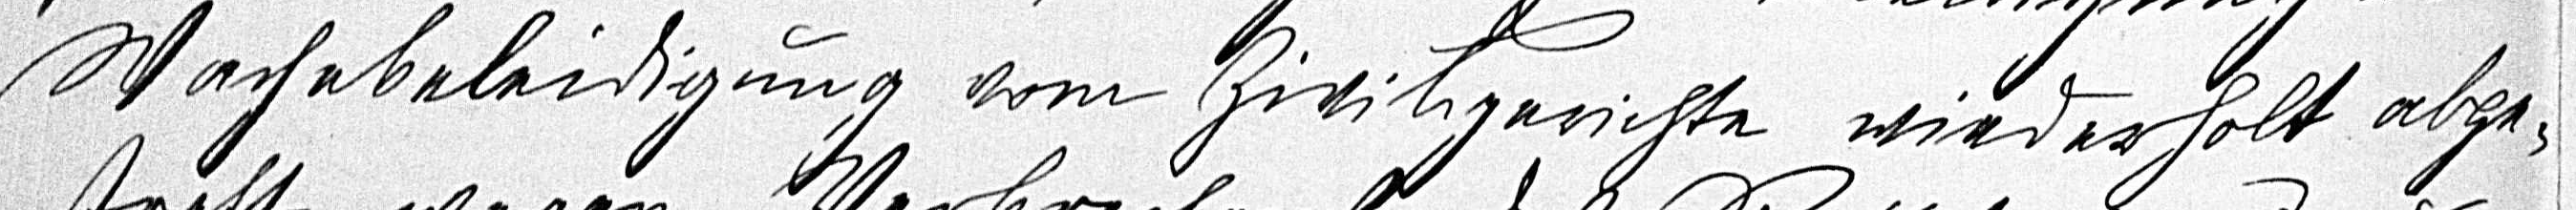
Wachebeleidigung vom Zivilgerichte wiederholt abge¬
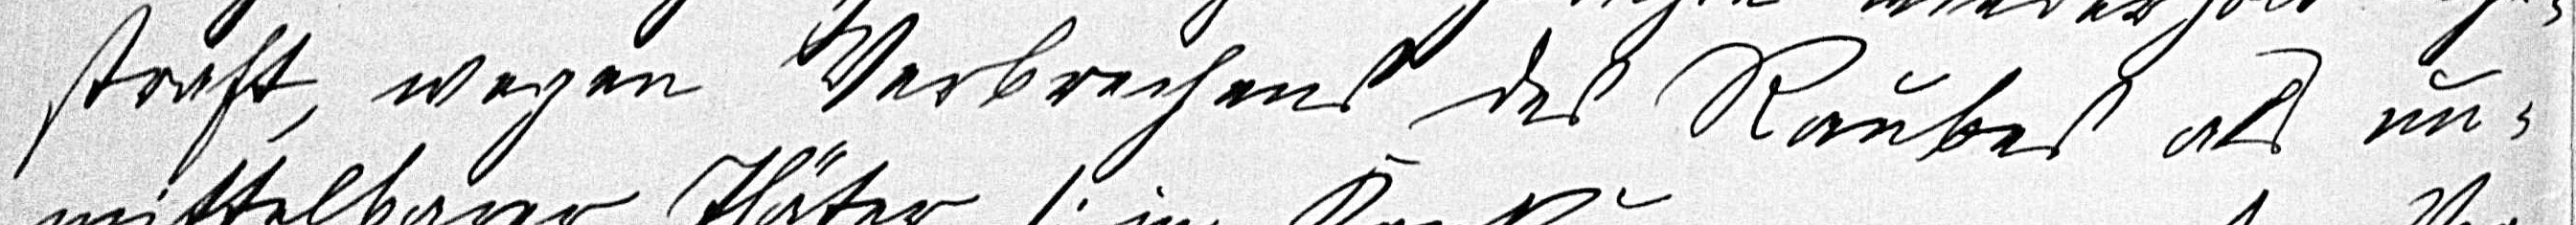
straft, wegen Verbrechens des Raubes als un¬
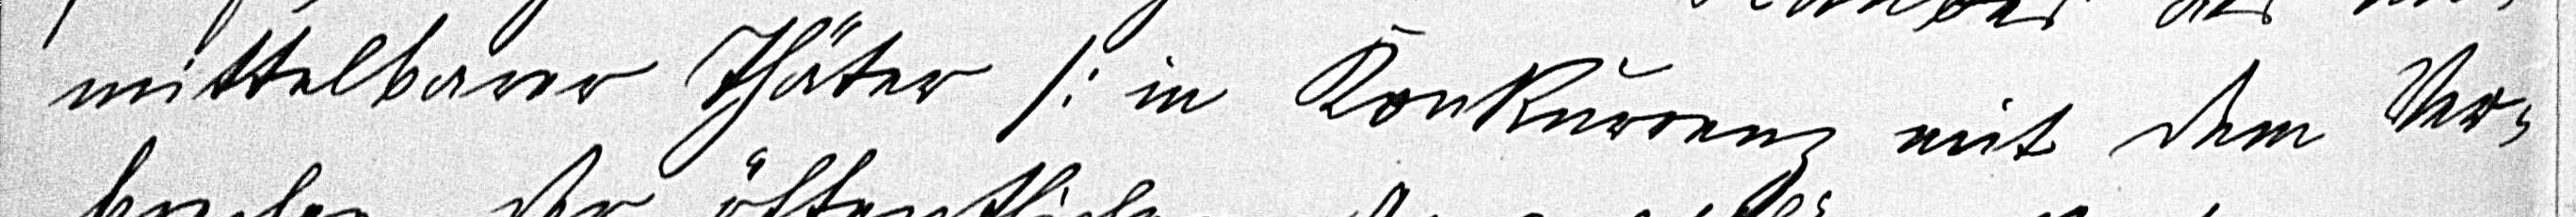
mittelbarer Thäter (im Konkurrenz mit dem Ver¬
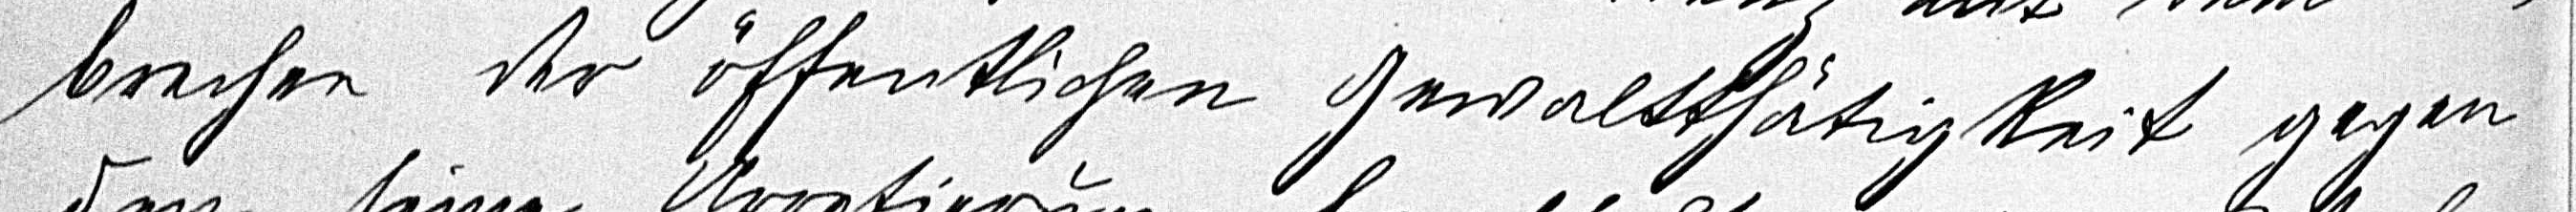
brechen der öffentlichen gewaltthätigkeit gegen
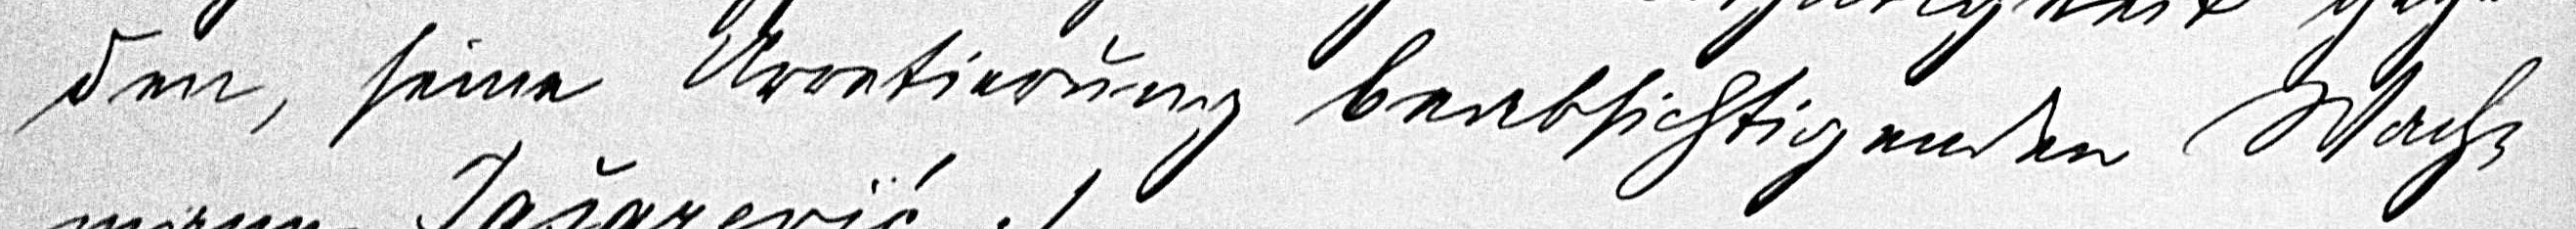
den, seine Arretierung beabsichtigenden Wach¬
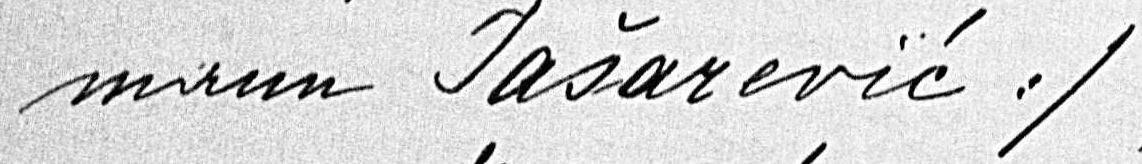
mann Jašarević),
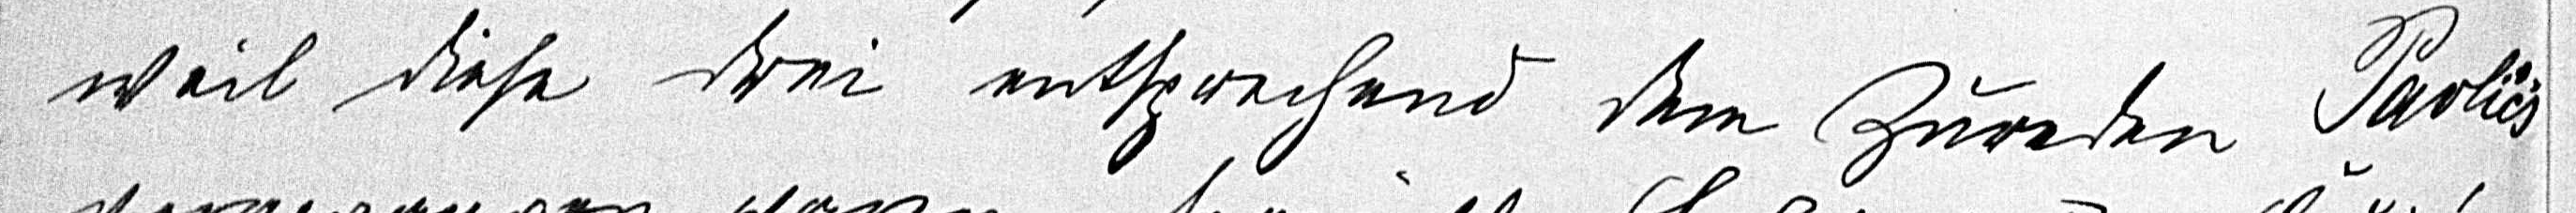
weil diese drei entsprechen dem Zureden Pavlićs
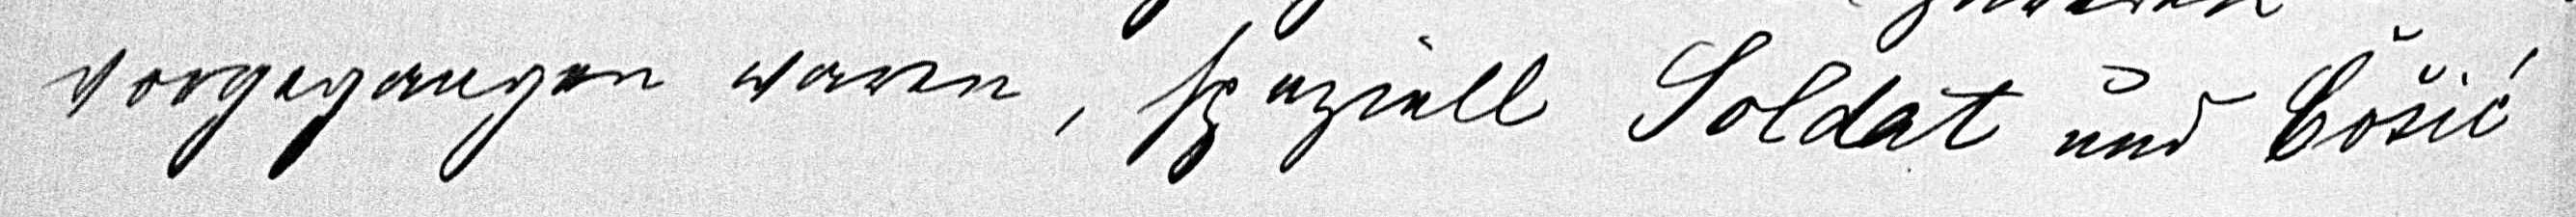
vorgegangen waren, speziell Soldat und Čošić
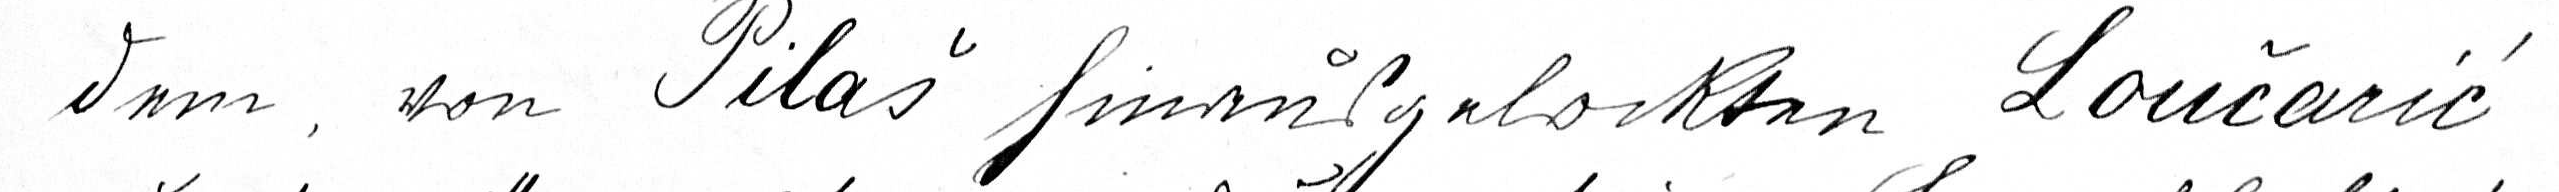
dem, von Pilaš hinausgelockten Loučarić
